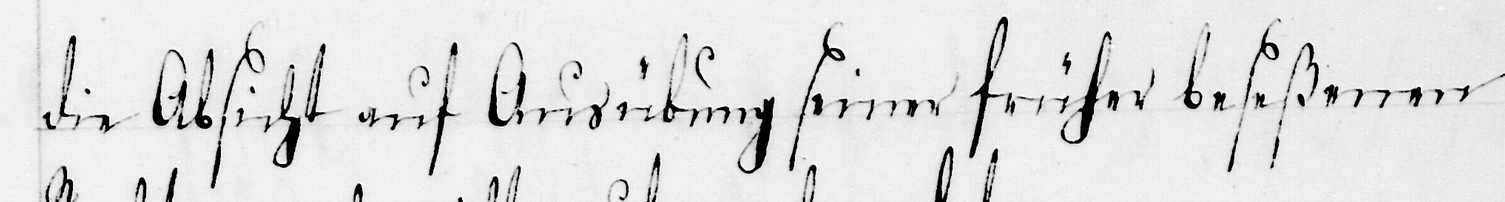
die Absicht auf Ausübung seiner früher beseßenen
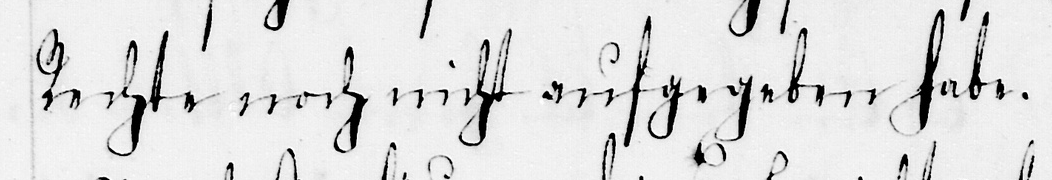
Rechte noch nicht aufgegeben habe.
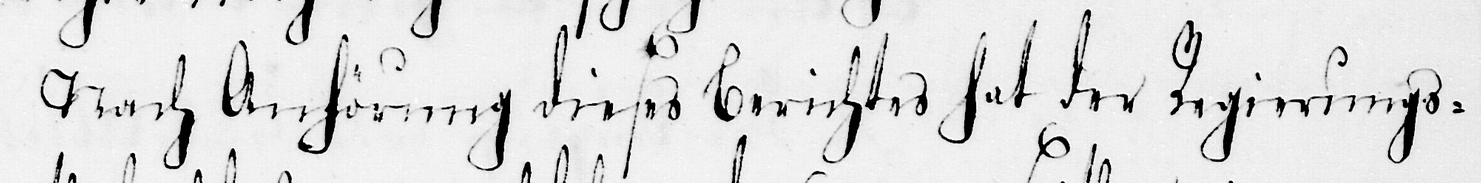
Nach Anhörung dieses Berichtes hat der Regierungs¬
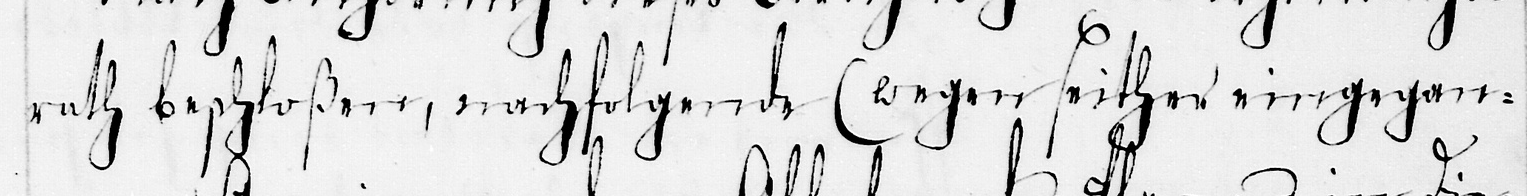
rath beschloßen, nachfolgende (wegen seither eingegan¬
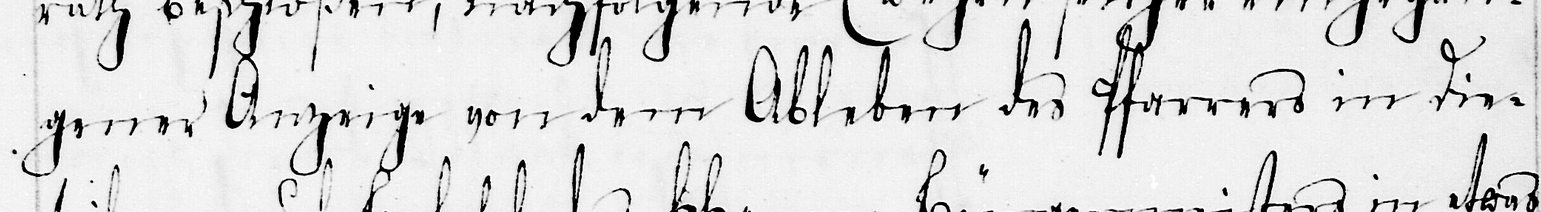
gener Anzeige von dem Ableben des Pfarrers in Die¬
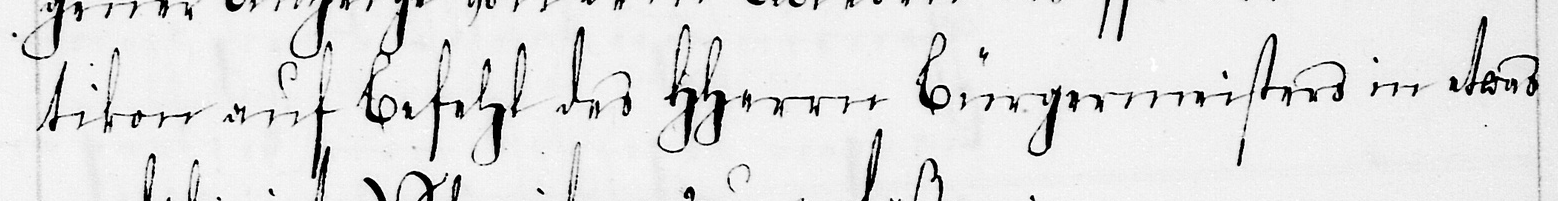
tikon auf Befehl des HHerrn Bürgermeisters in etwas
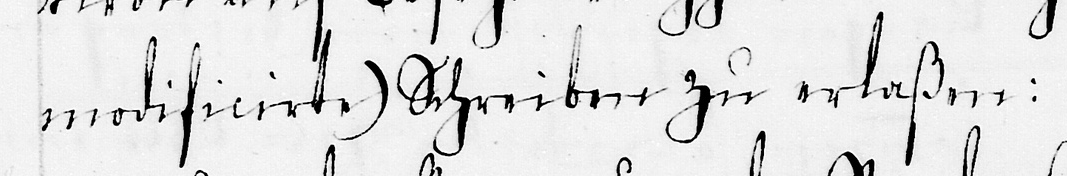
modificirte) Schreiben zu erlaßen:
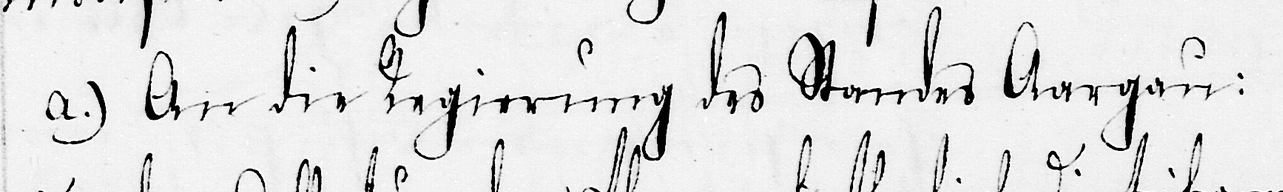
a.) An die Regierung des Standes Aargau:
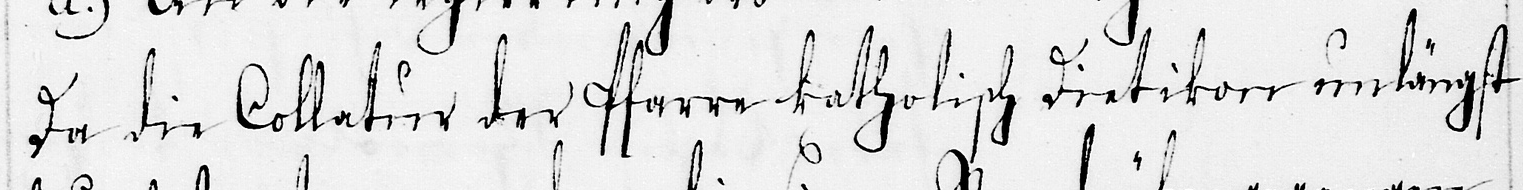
Da die Collatur der Pfarre katholisch Dietikon unlängst
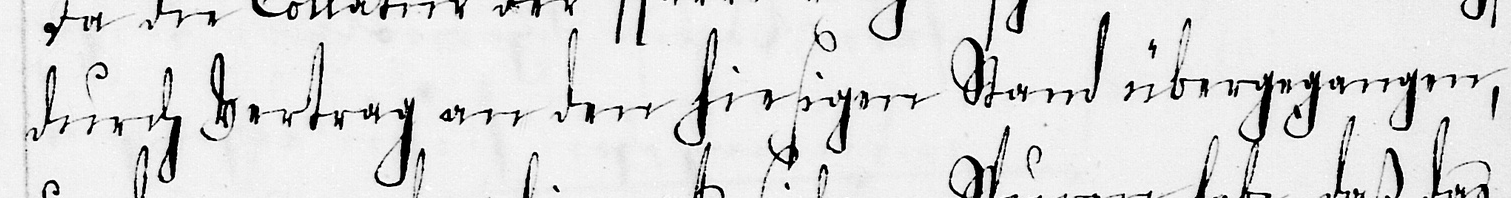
durch Vertrag an den hiesigen Stand übergegangen,
